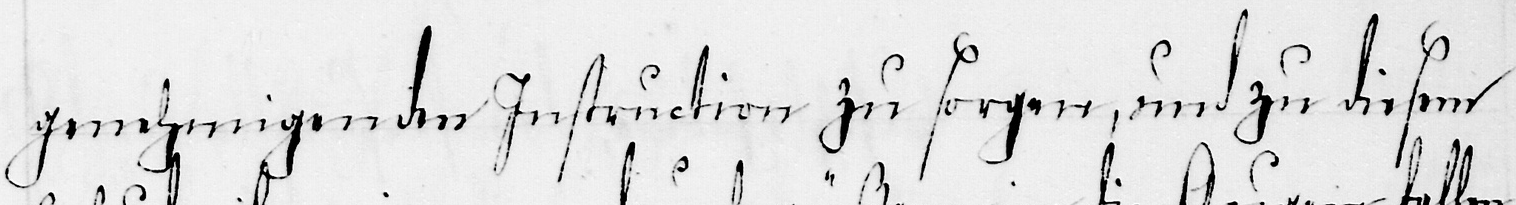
genehmigenden Instruction zu sorgen, und zu diesem
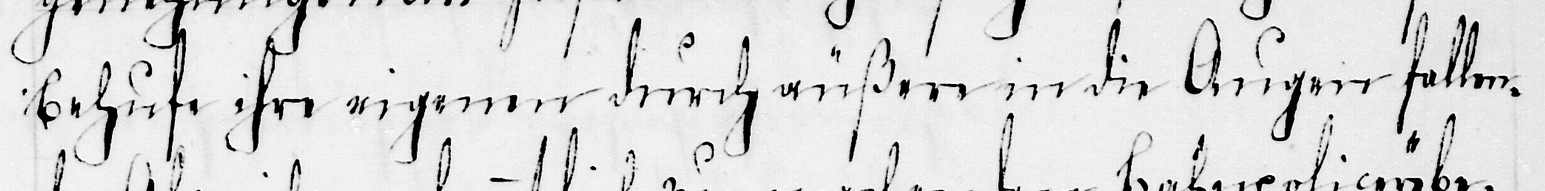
Behufe ihre eigenen durch äußere in die Augen fallen¬
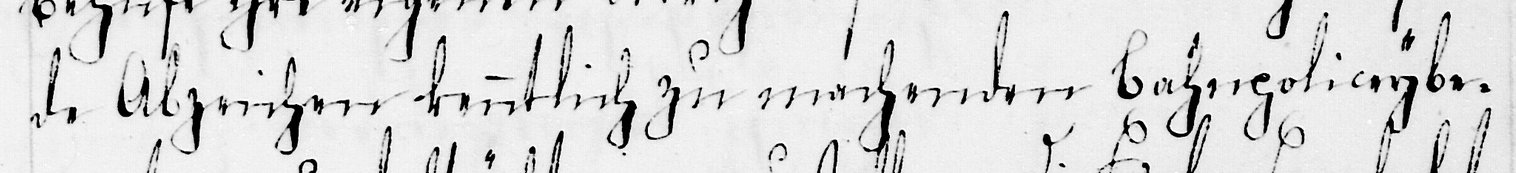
de Abzeichen kenntlich zu machenden Bahnpoliceybe¬
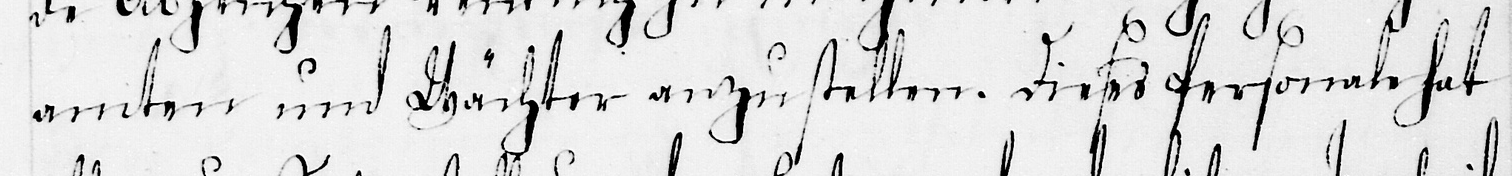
amten und Wächter anzustellen. Dieses Personale hat
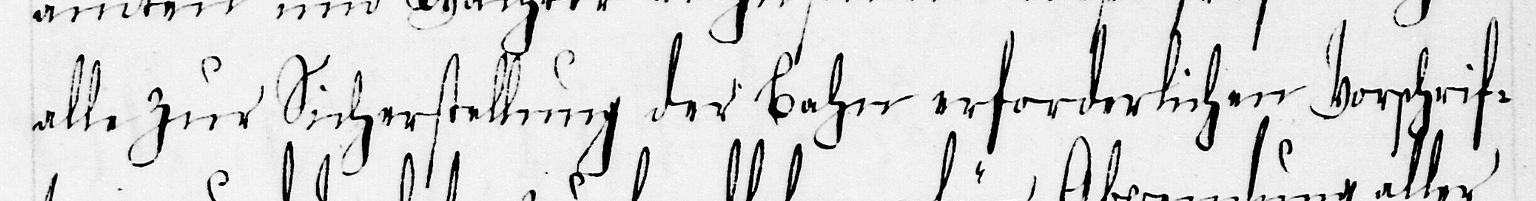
alle zur Sicherstellung der Bahn erforderlichen Vorschrif¬
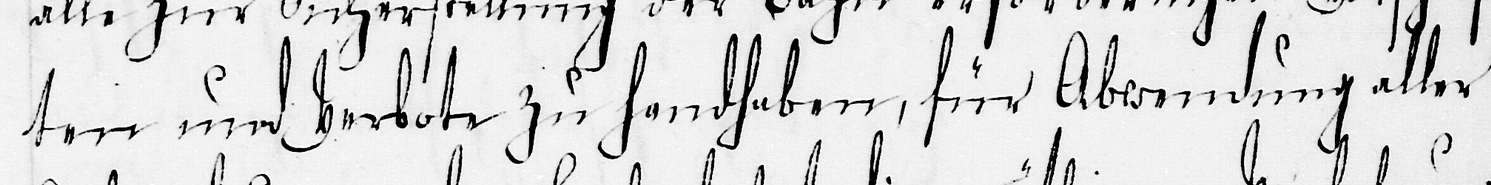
ten und Verbote zu handhaben, für Abwendung aller
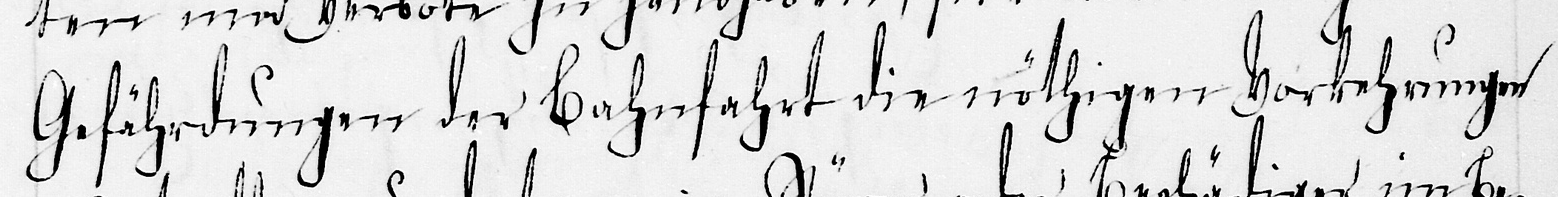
Gefährdungen der Bahnfahrt die nöthigen Vorkehrungen
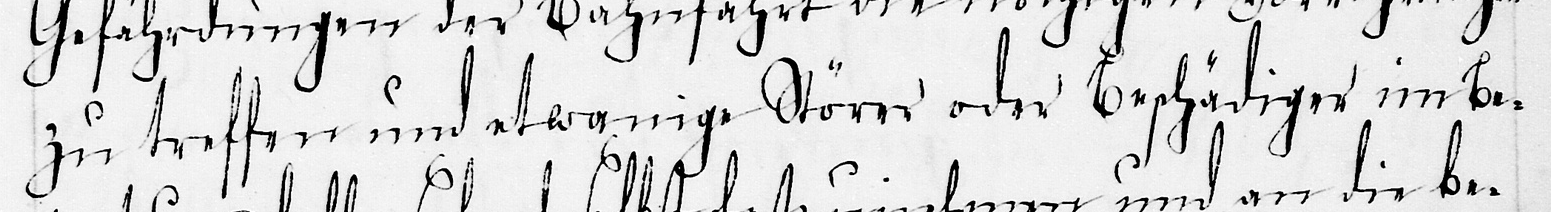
zu treffen und etwanige Störer oder Beschädiger im Be¬
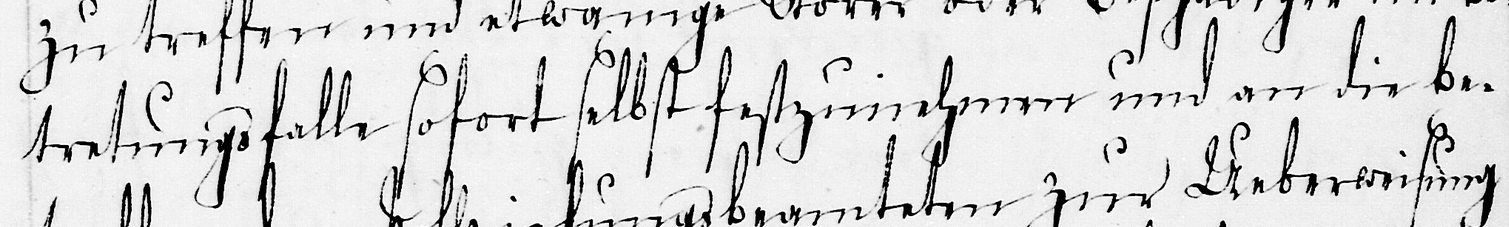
tretungsfalle sofort selbst festzunehmen und an die be¬
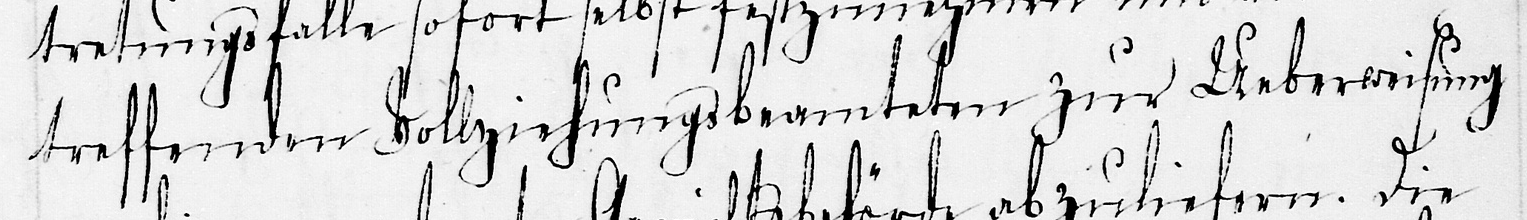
treffenden Vollziehungsbeamteten zur Ueberweisung
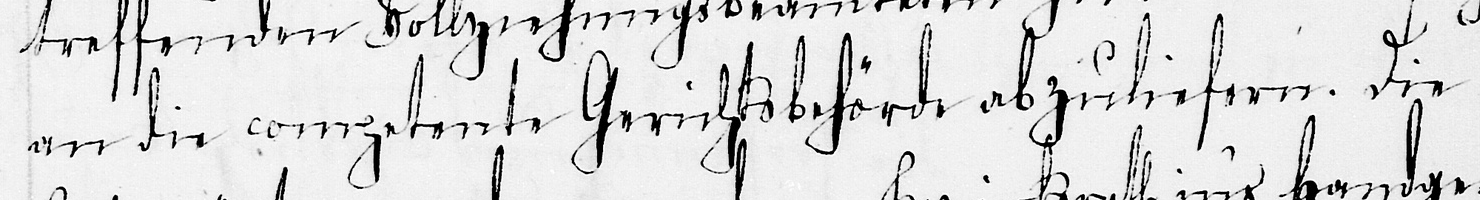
an die competente Gerichtsbehörde abzuliefern. Die
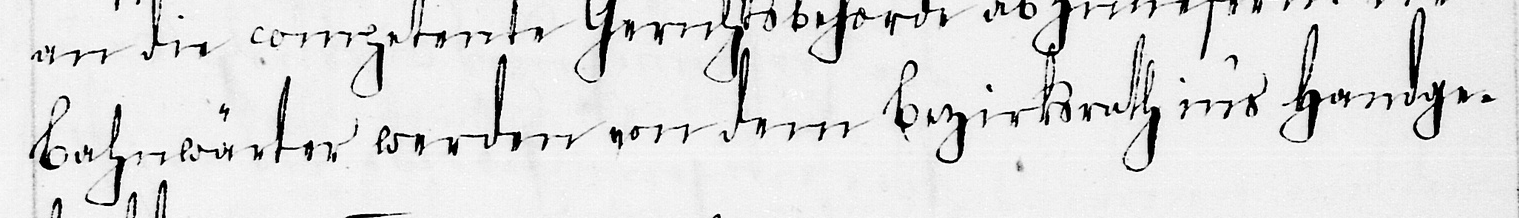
Bahnwärter werden von dem Bezirksrath in’s Handge¬
